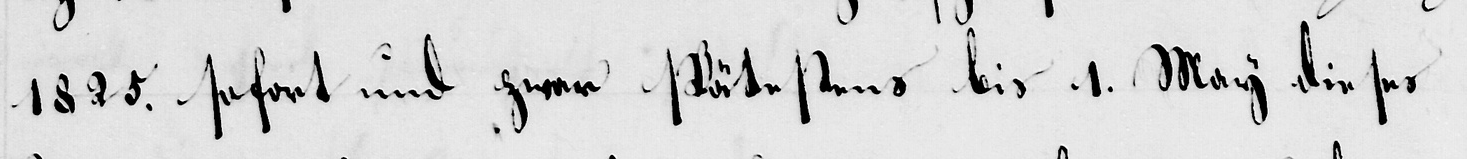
1825. sofort und zwar spätestens bis 1. May dieses
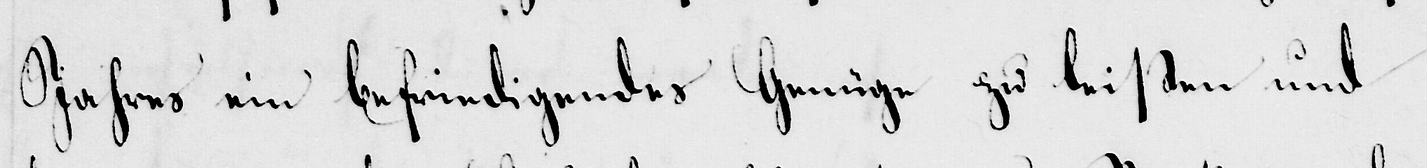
Jahres befriedigendes Genüge zu leisten und
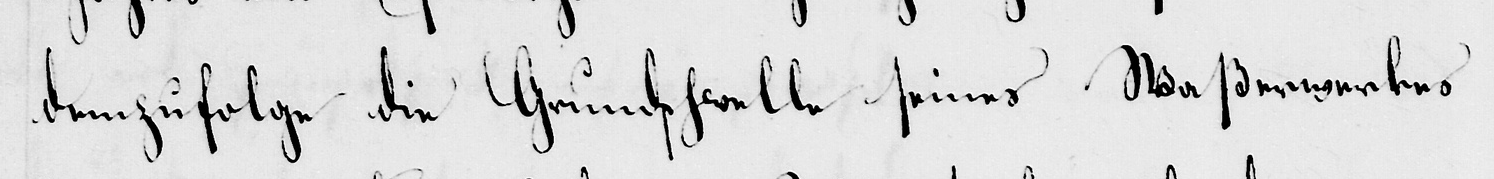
demzufolge die Grundschwelle seines Waßerwerkes
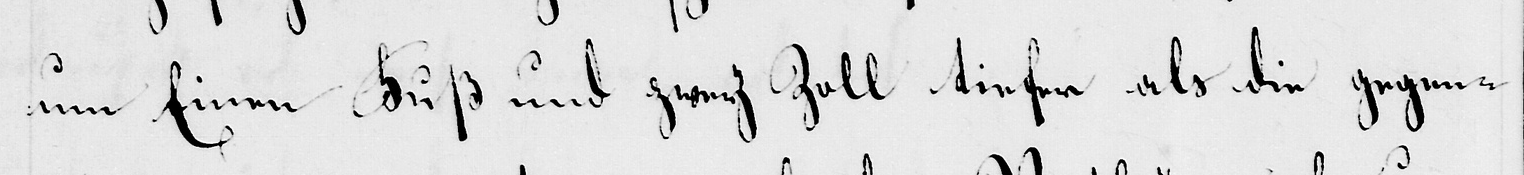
um Einen Fuß und zwey Zoll tiefer als die gegen¬
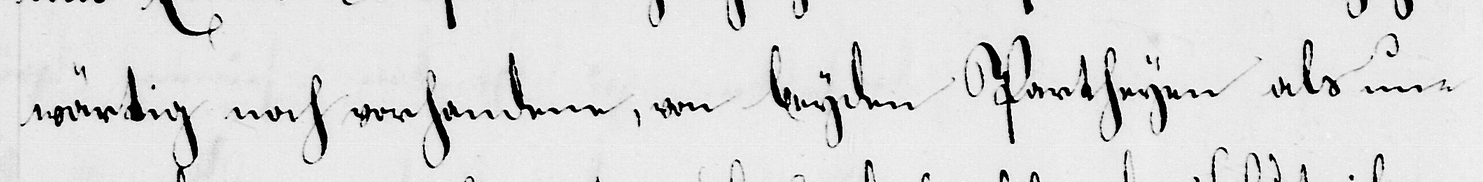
wärtig noch vorhandene, von beyden Partheyen als un¬
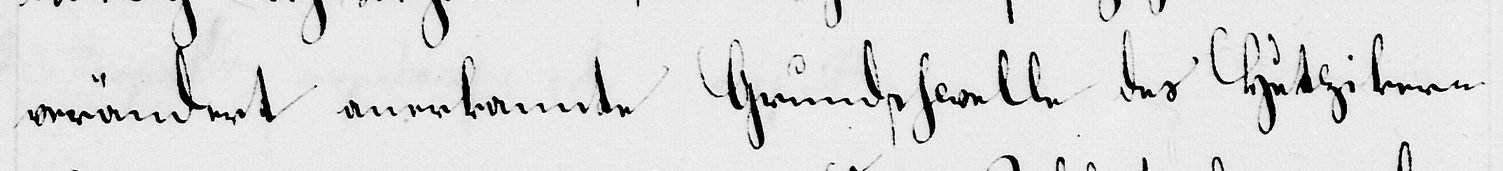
verändert anerkannte Grundschwelle des Hutziker-B¬
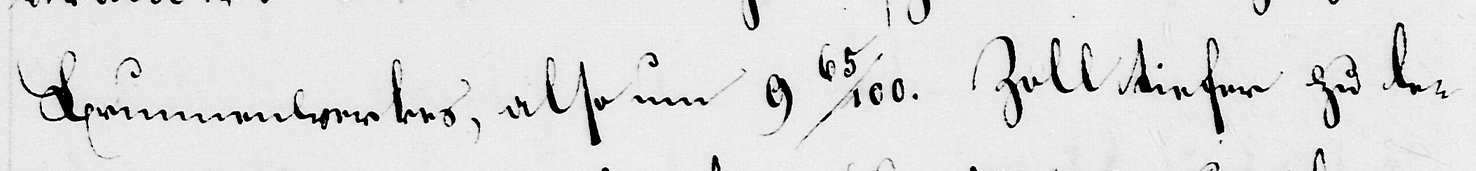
runnenwerkes , also um 9 65/100. Zoll tiefer zu le¬
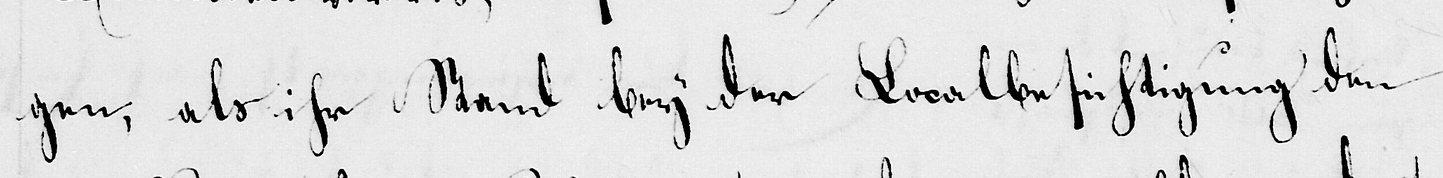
gen, als ihr Stand bey der Localbesichtigung den
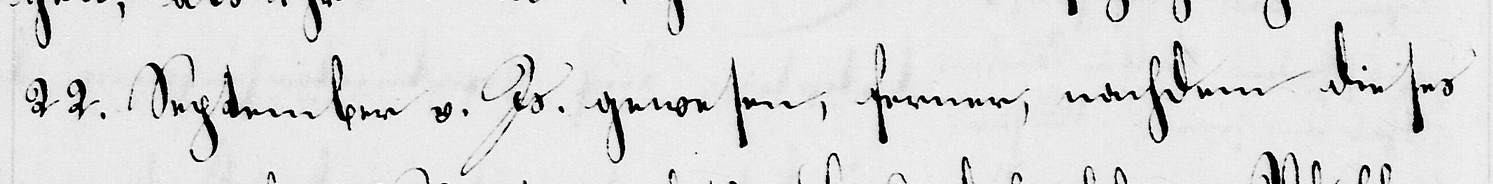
22. September v. Js. gewesen, ferner, nachdem dieses
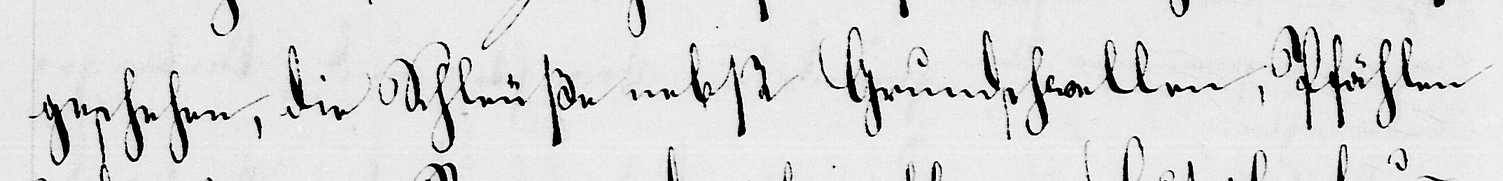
geschehen, die Schleuße nebst Grundschwellen, Pfählen
